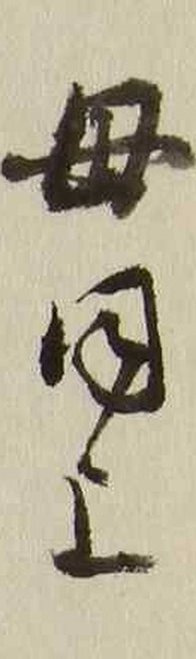母同上
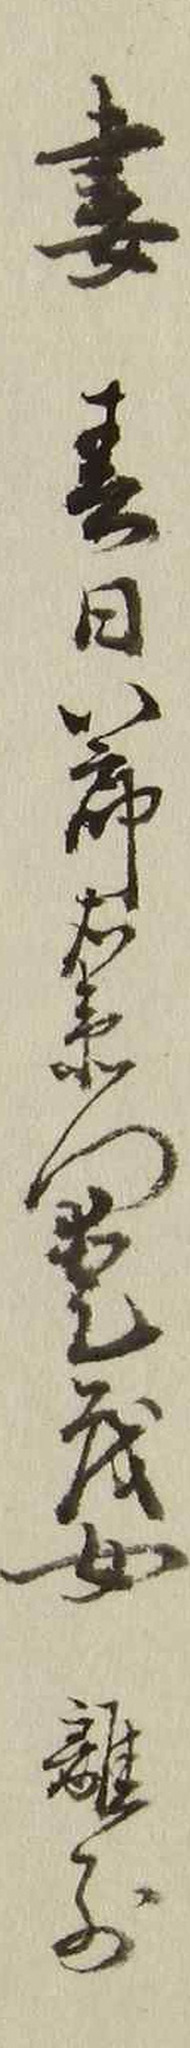妻春日八郎右衛門愛茂女離別
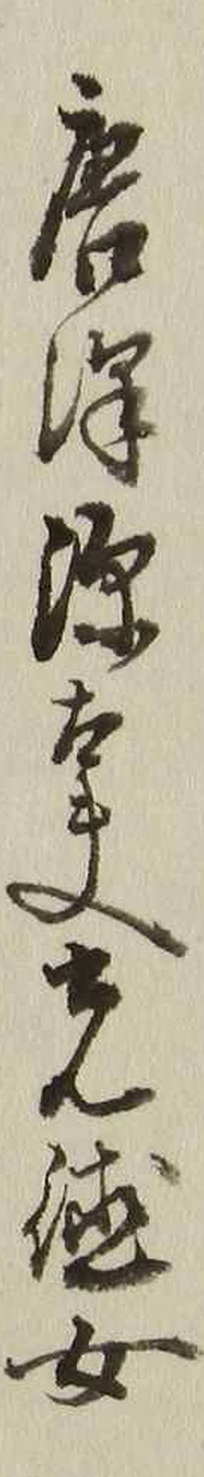唐沢源太夫先徳女
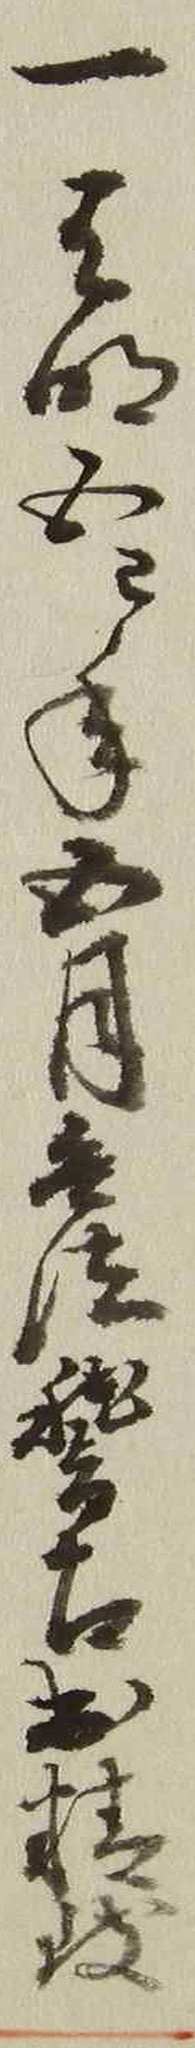一天明五巳年五月兵法稽古出精致
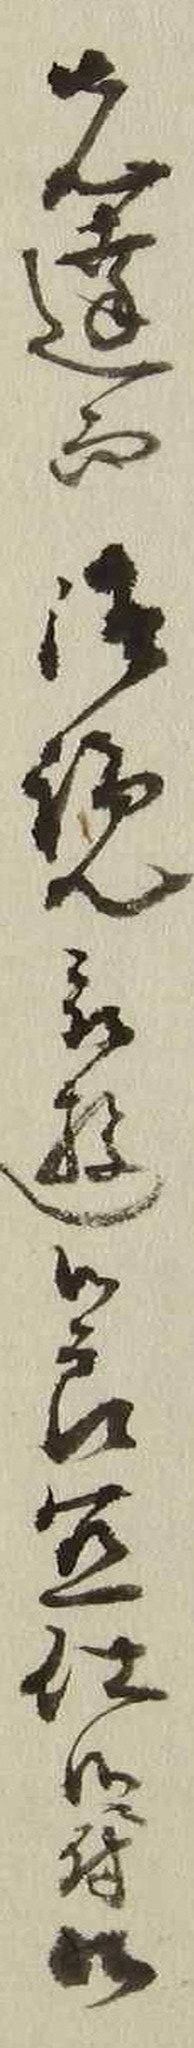先達而御覧被遊候節宜仕候ニ付御
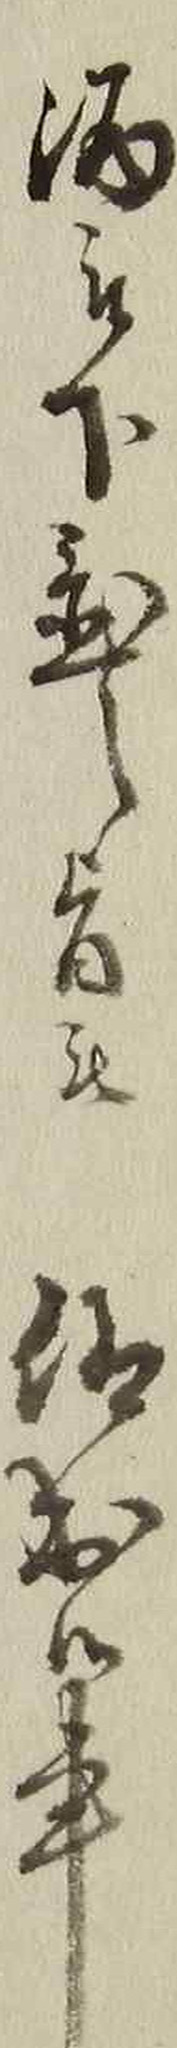酒被下置之旨被仰出候事
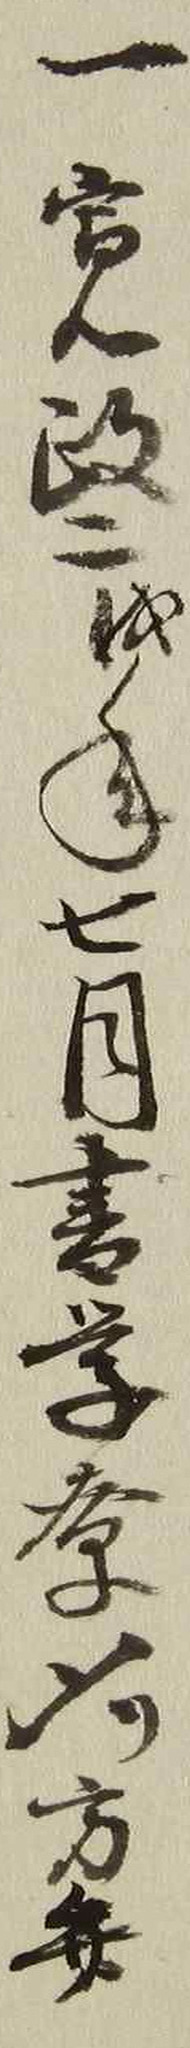一寛政二戌年七月書学寮〆り方弁
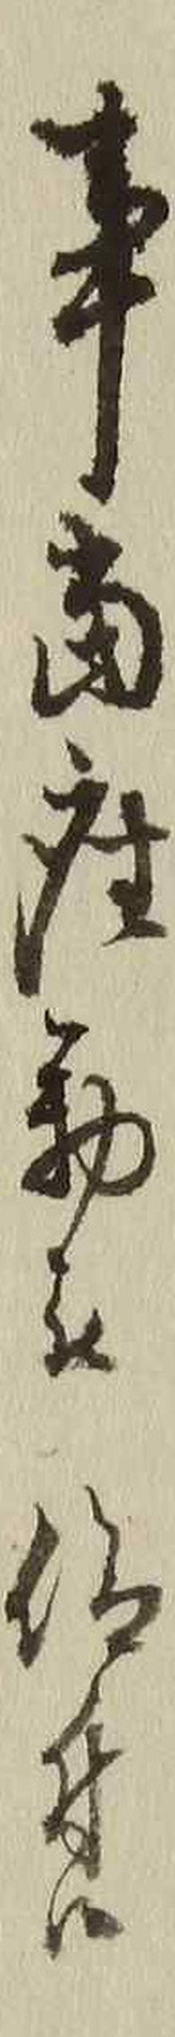事当座勤被仰付候
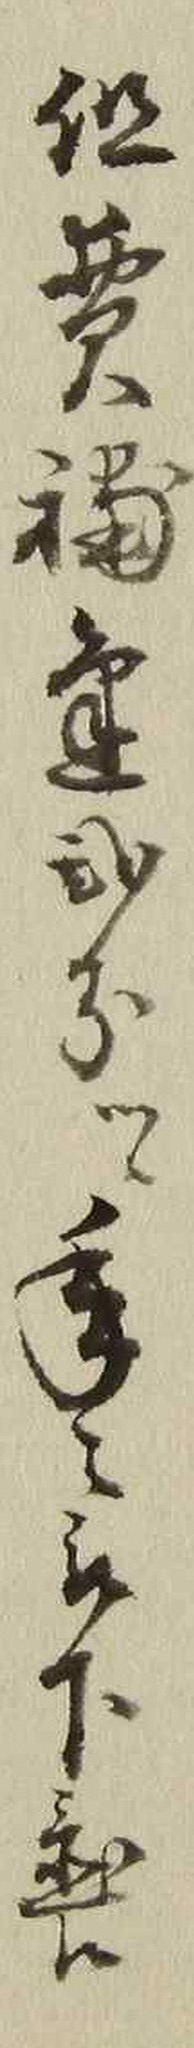但費補金弐分ツヽ年々被下置候
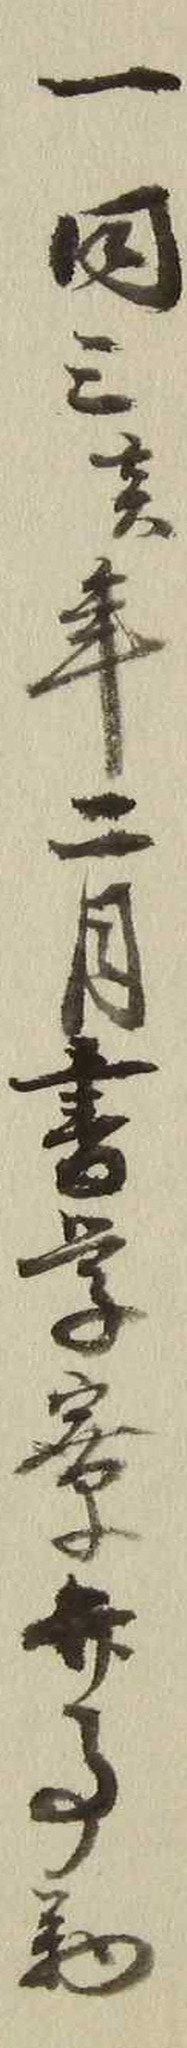一同三亥年二月書学寮弁事勤
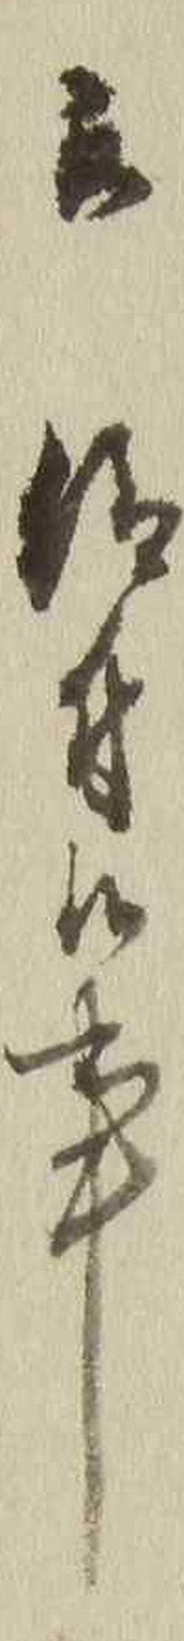被仰付候事
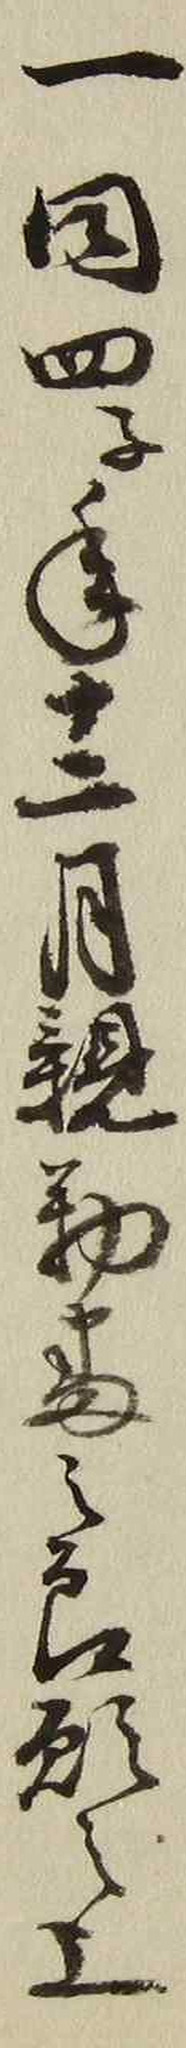一同四子年十二月親勤番之節願之上
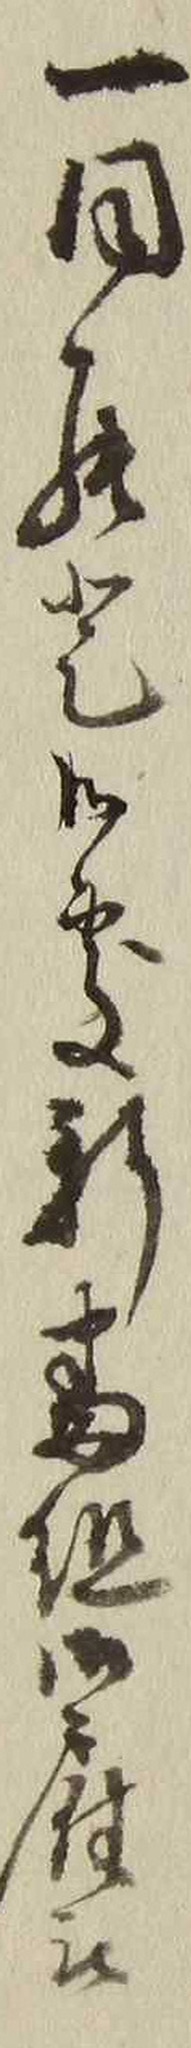一同罷登候処新番組御雇被
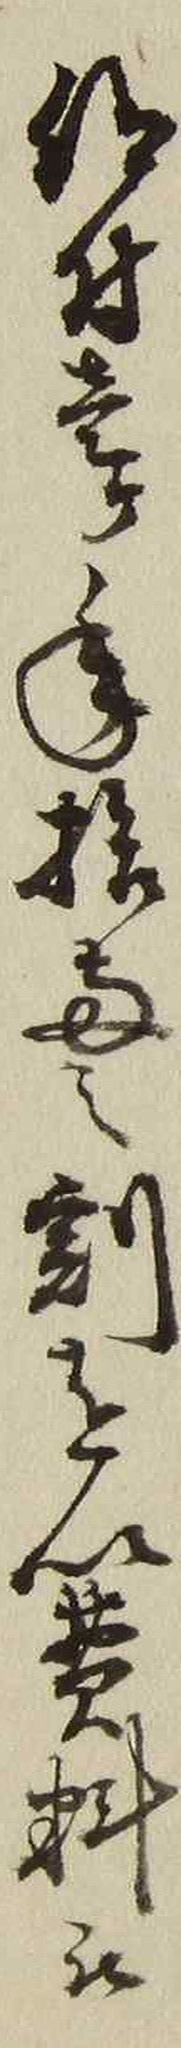仰付壱ヶ年拾両之割を以費料被
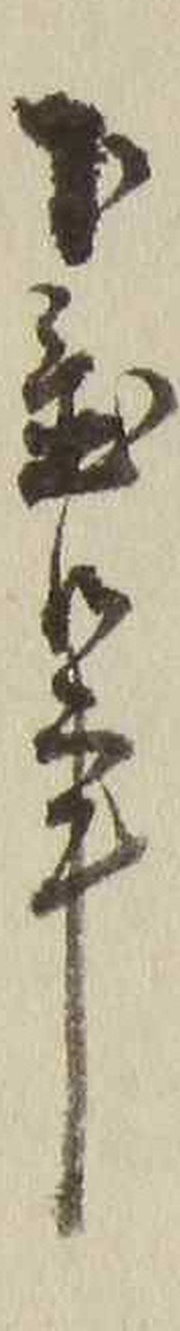下置候事
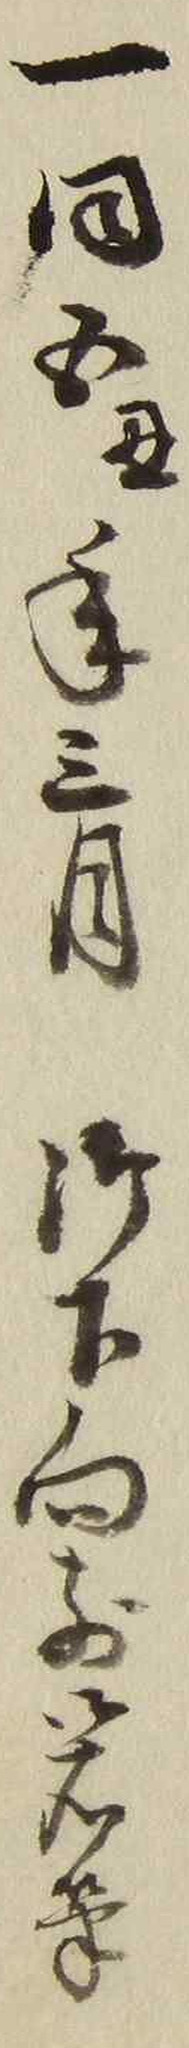一同五丑手三月御下向前御右筆
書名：諸士系譜　巻之36　は之部4
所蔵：会津若松市立会津図書館
